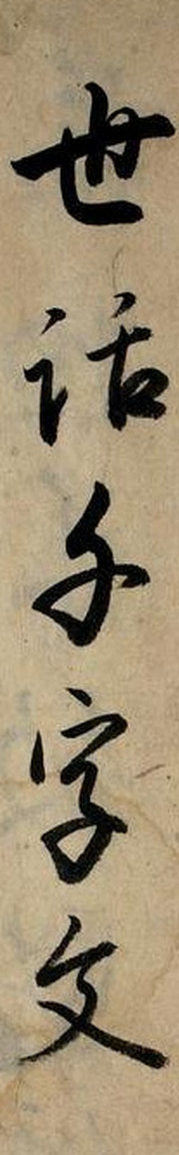世話千字文
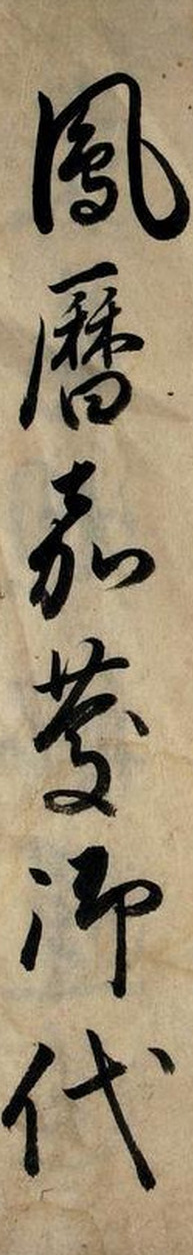鳳暦嘉慶御代
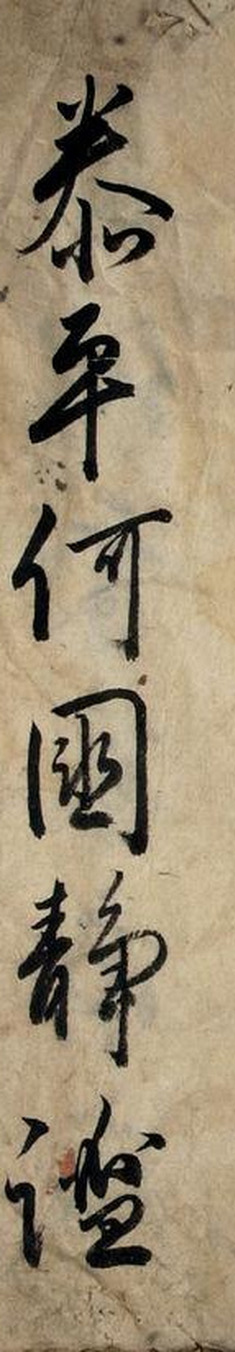泰平何国静謐

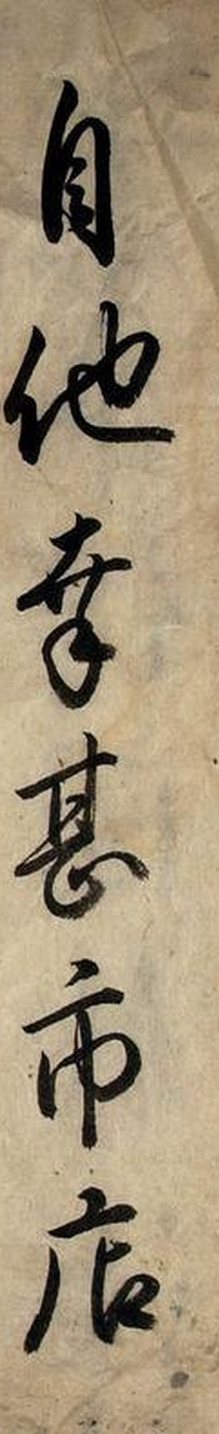自他幸甚市店
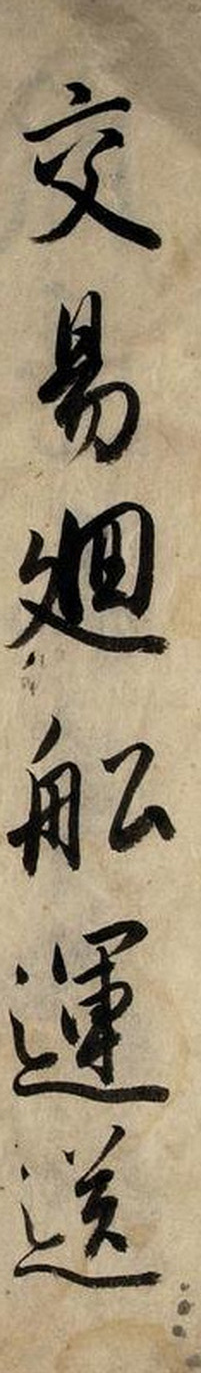交易廻船運送
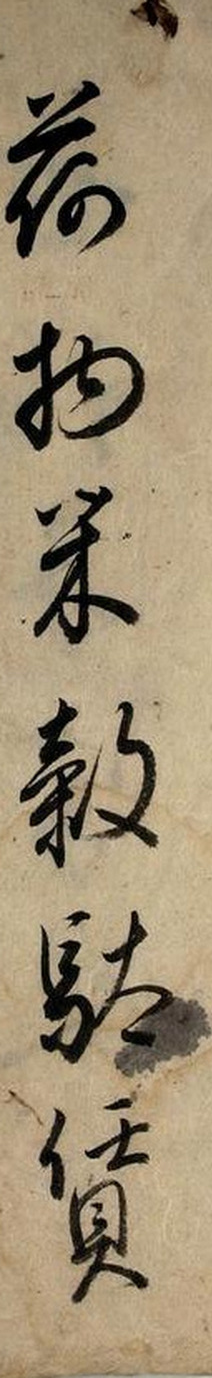荷物米穀駄賃
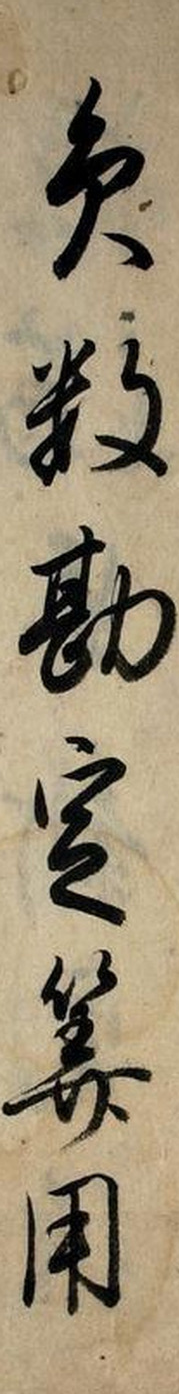員数勘定算用
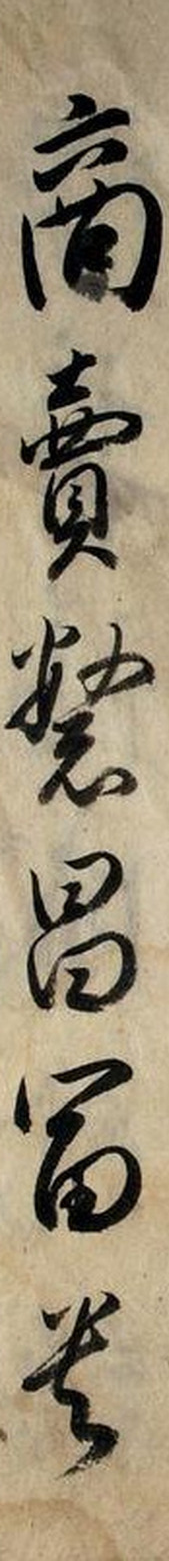商売繁昌富貴
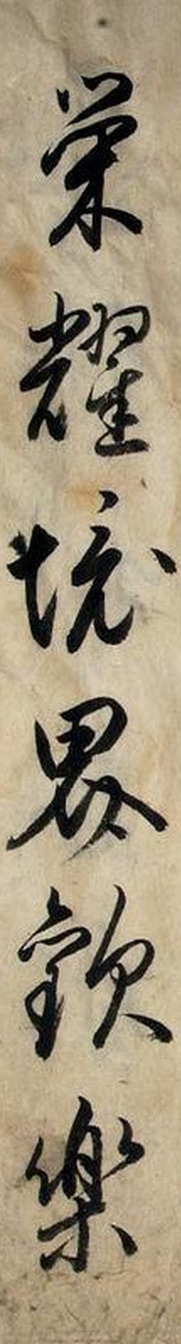栄耀境界歓楽

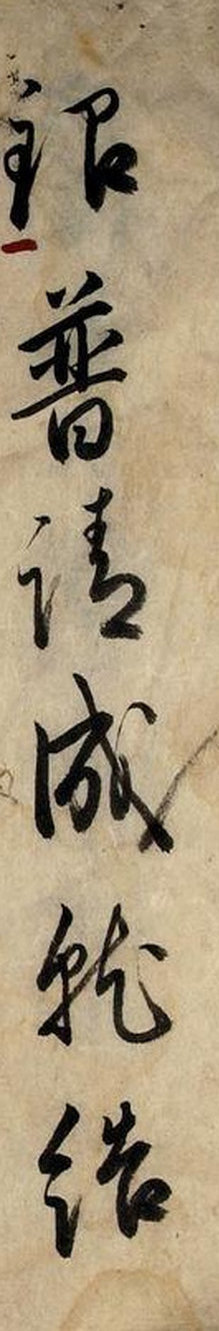銀普請成就結
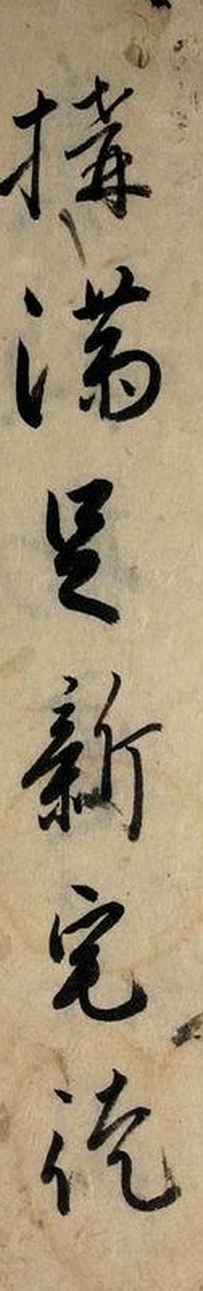構満足新宅徒
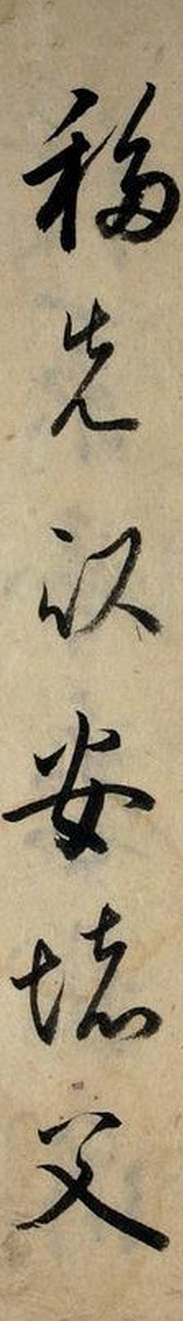移先以安堵父
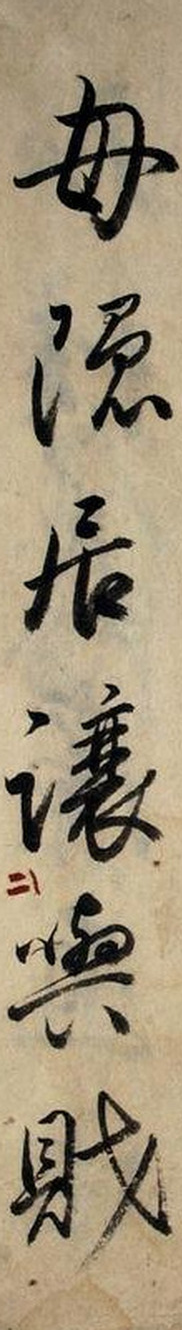母隠居譲与財
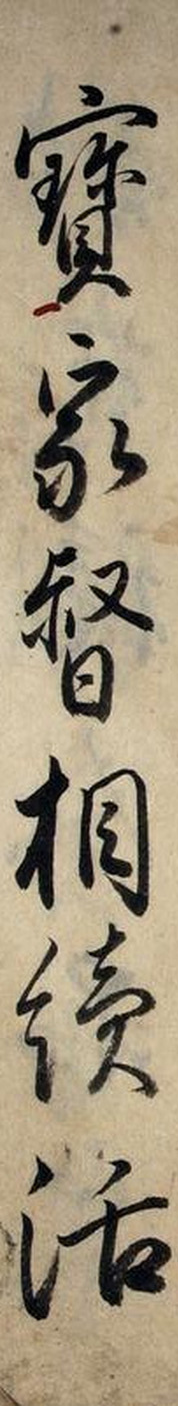宝家督相続活

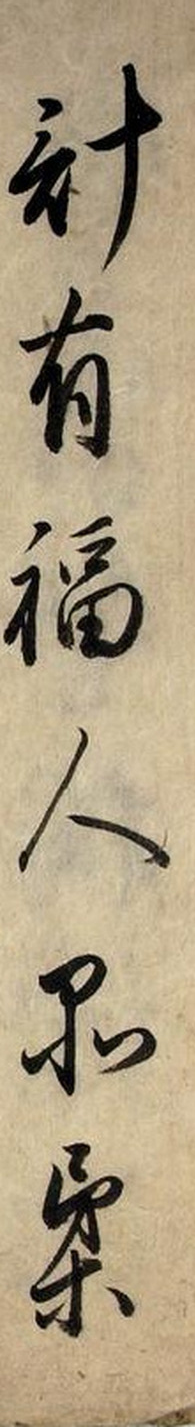計裕福人品柔
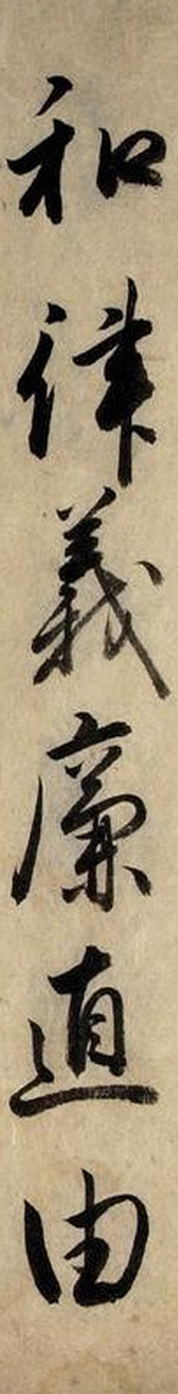和律儀廉直由
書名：世話千字文（手習手本）
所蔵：福井県文書館 Fukui Prefectural Archives
